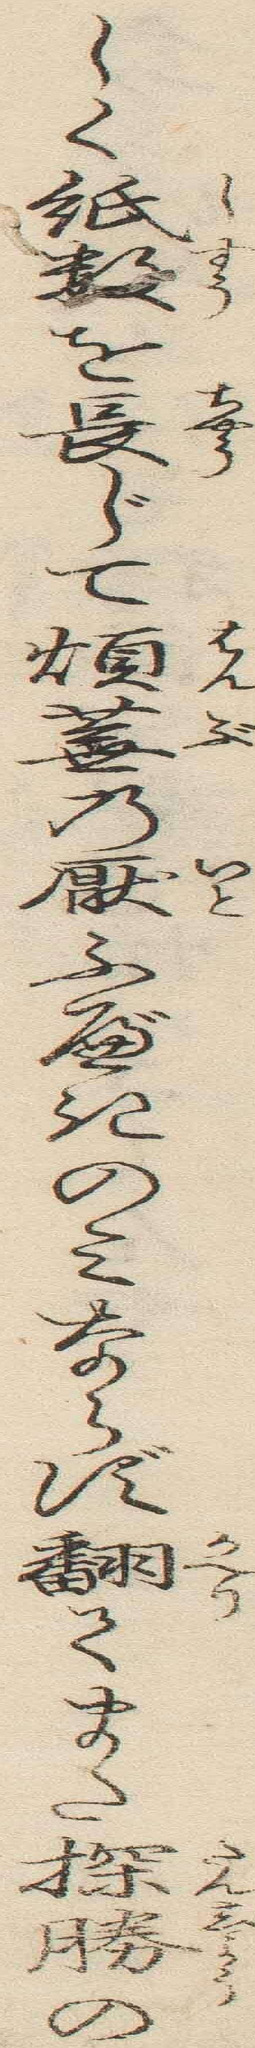しく紙数を長じて煩蕪の厭ふべきのみならず翻てまた探勝の
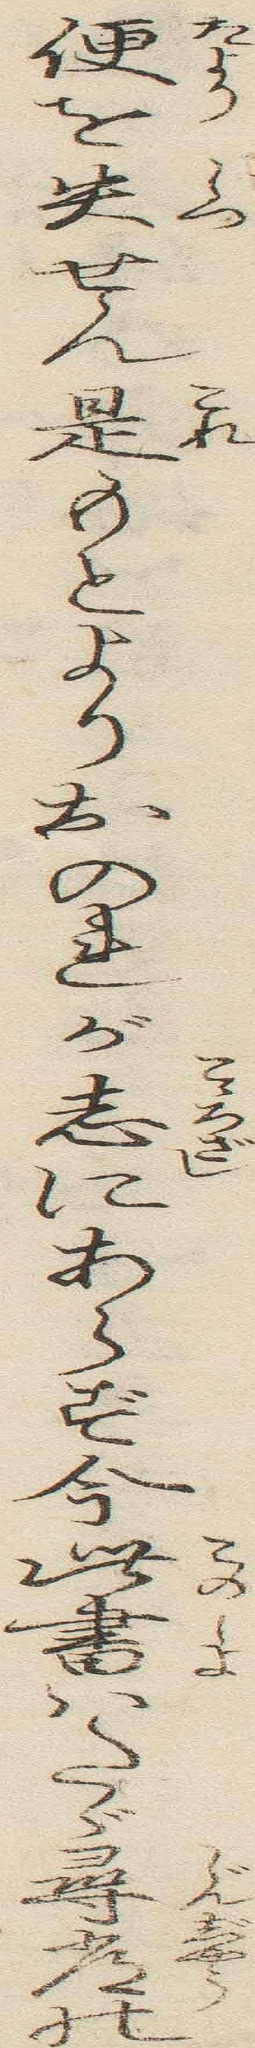便を失せん是もとよりおのれが志にあらず今此書はたゞ尋常の
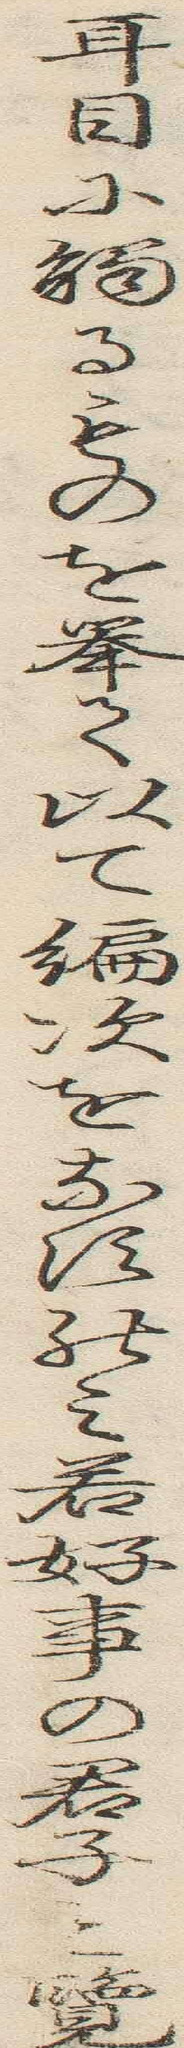耳目に觸るものを挙て以て編次をなすのみ若好事の君子と覽
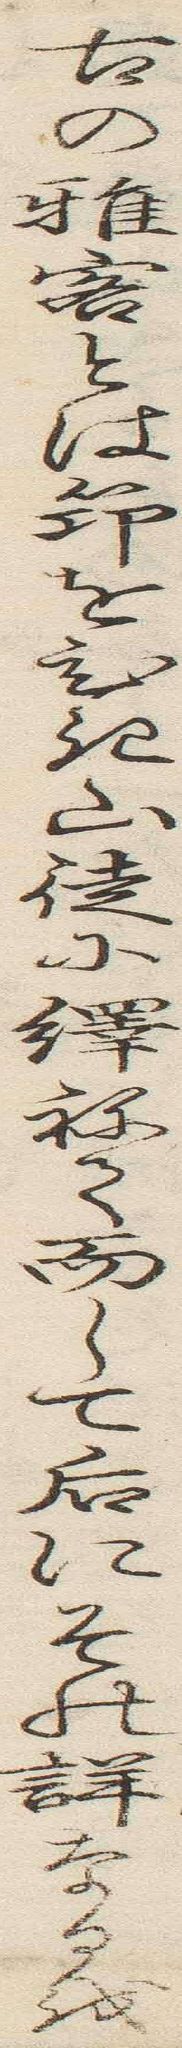古の雅客とは笻をひき山徒に繹ねて而して后にその詳なるを
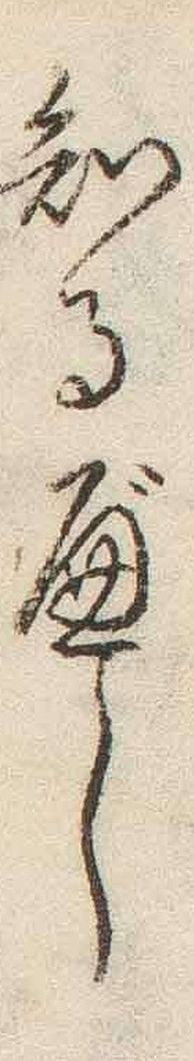知るべし
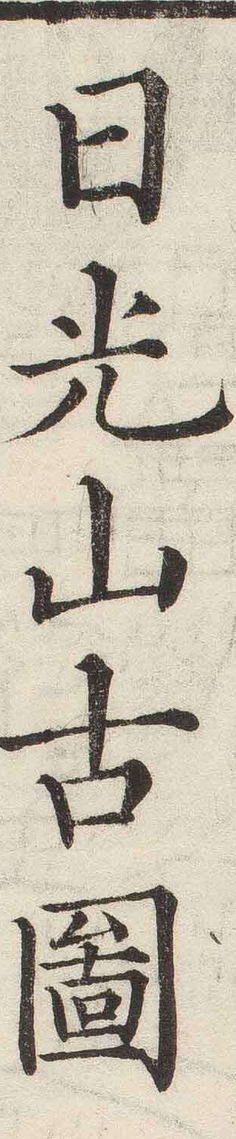日光山古圖
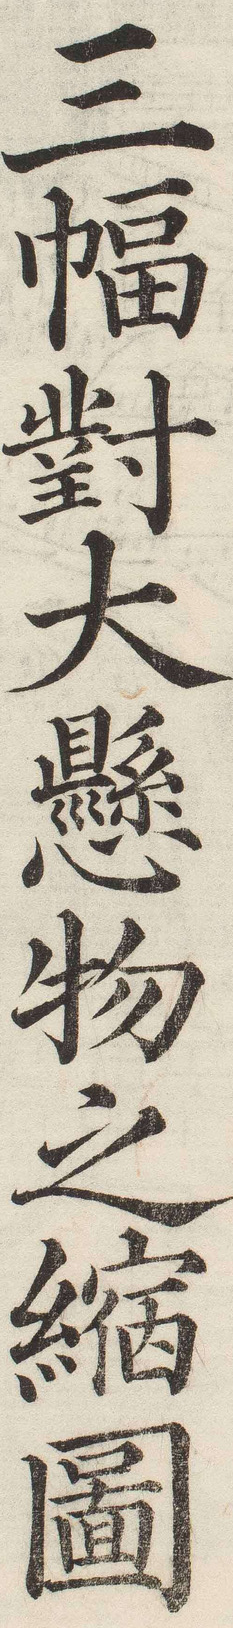三幅對大懸物之縮圖

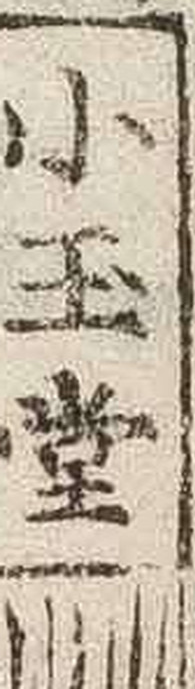小玉堂
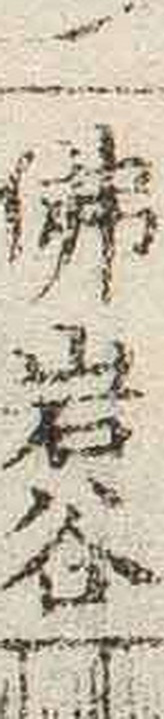佛岩谷
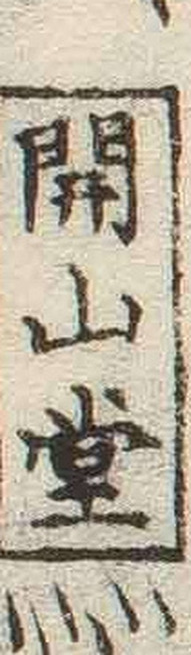開山堂

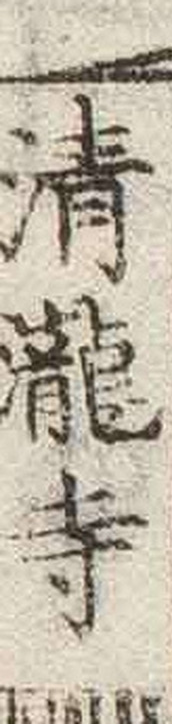清瀧寺
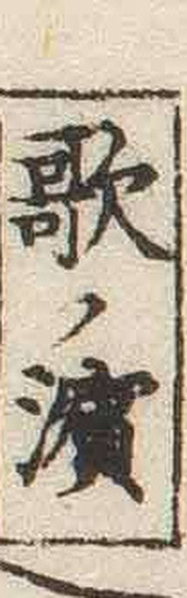歌ノ濵
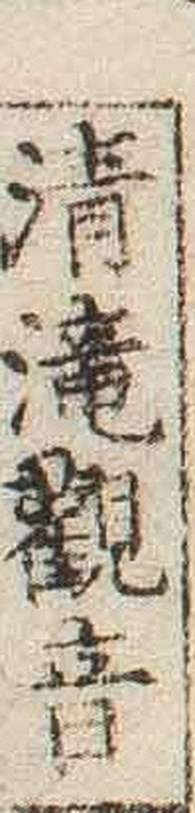清滝觀音
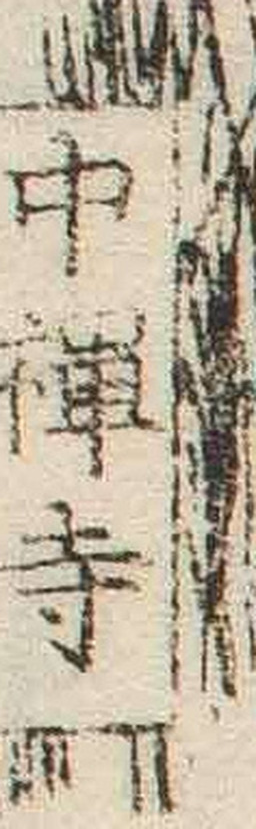中禅寺

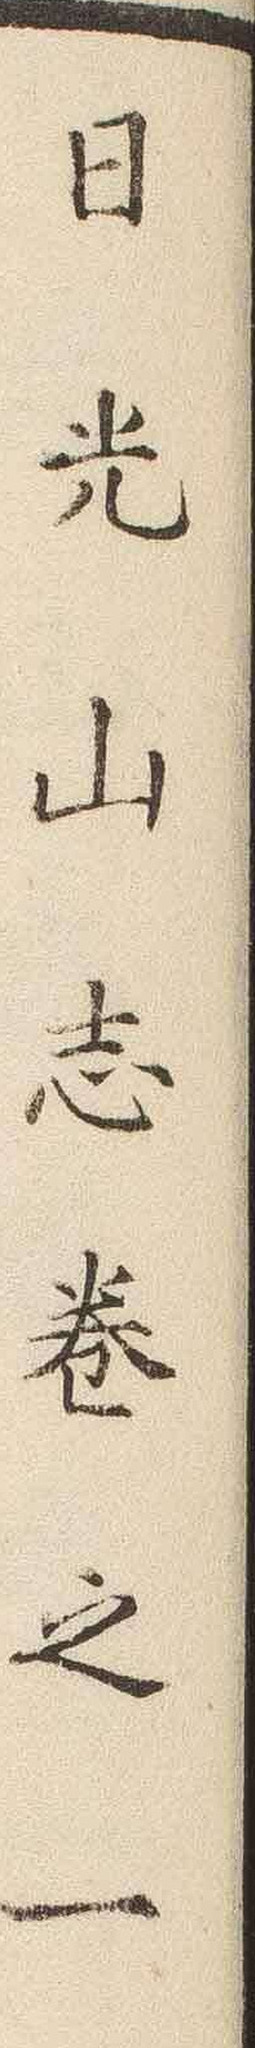日光山志巻之一

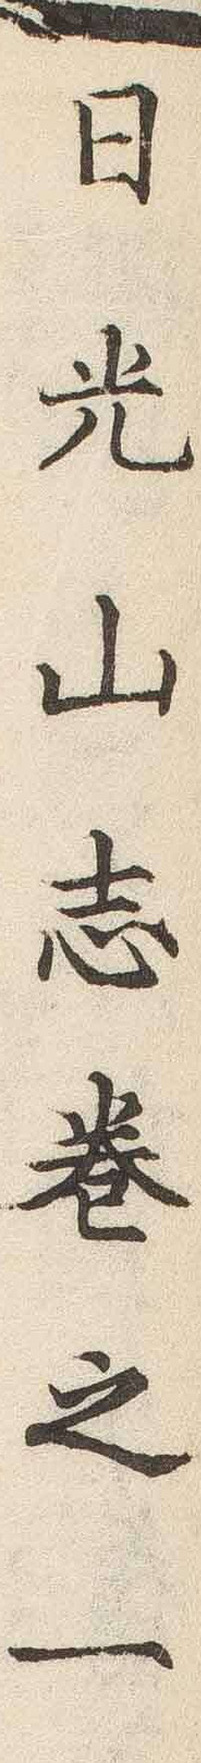日光山志巻之一
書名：日光山志
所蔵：東京学芸大学附属図書館 国文学研究資料館
